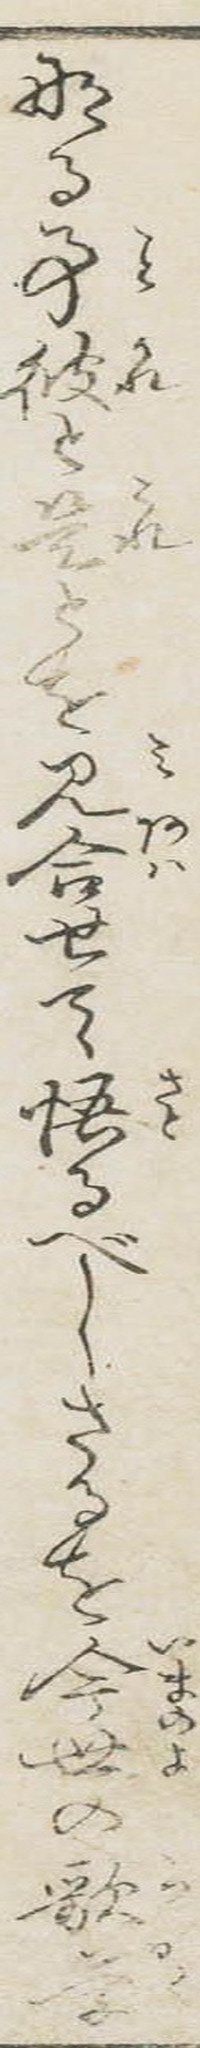なる事彼と是とを見合せて悟るべしさるを今世の歌学
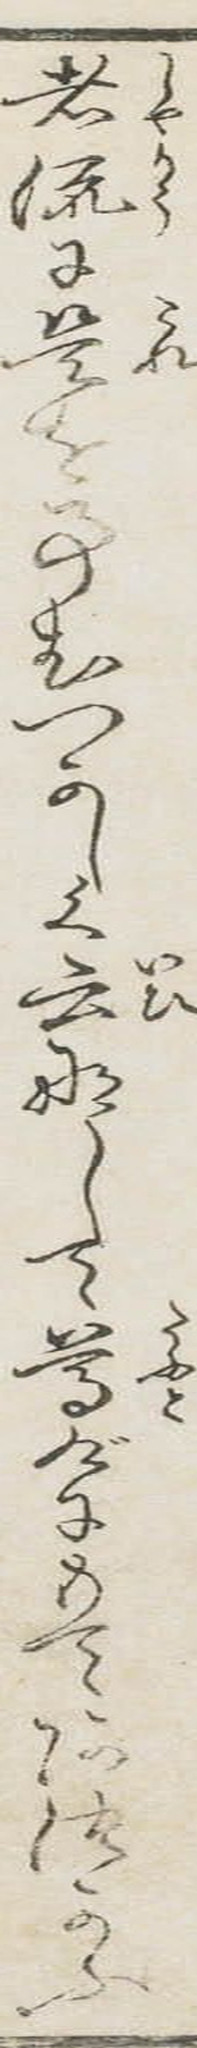者流に是を事むつかしく云なして尊げにもてあつかふ
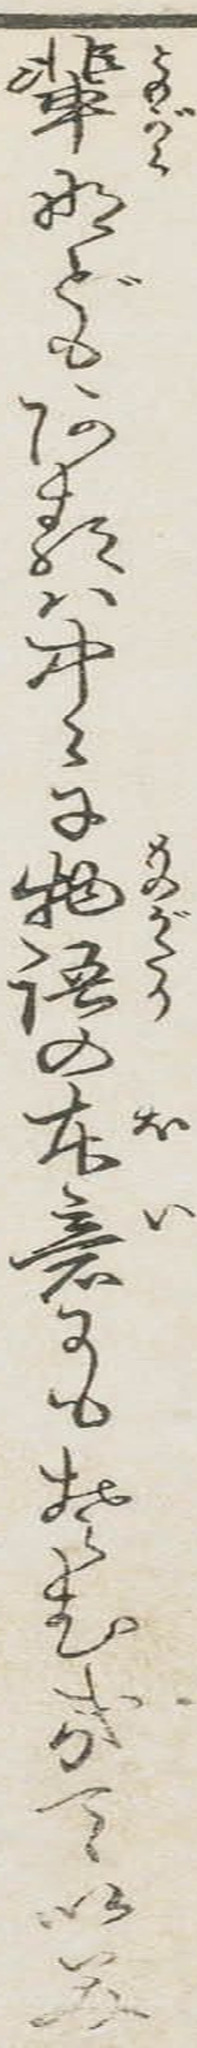輩などもあるは中々に物語の本意にもそむきていみ
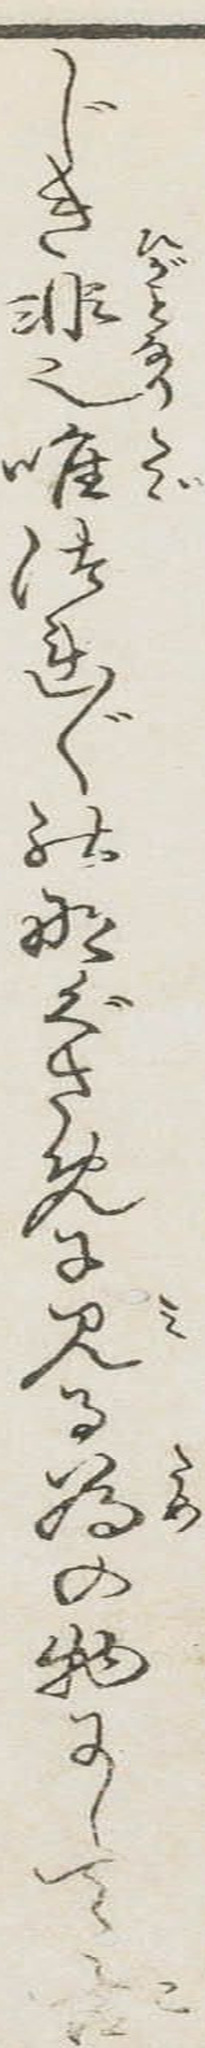じき非也唯つれ〴〵のなぐさめに見る為の物にして古
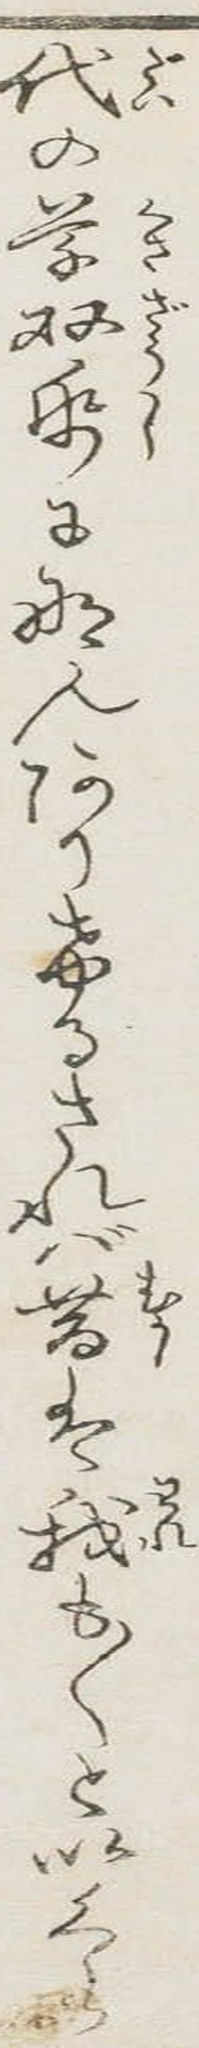代の草双紙になんありけるされば昔は我も〳〵といくら
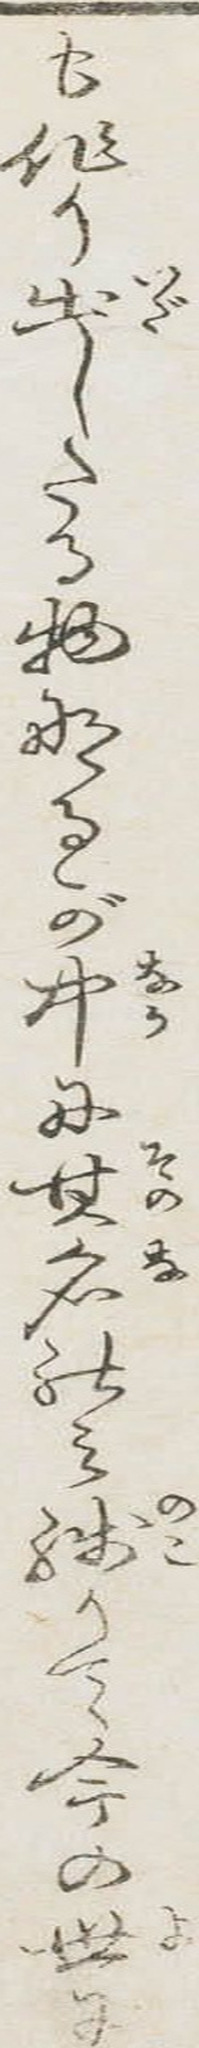も作り出したる物なるが中に其名のみ残りて今の世に
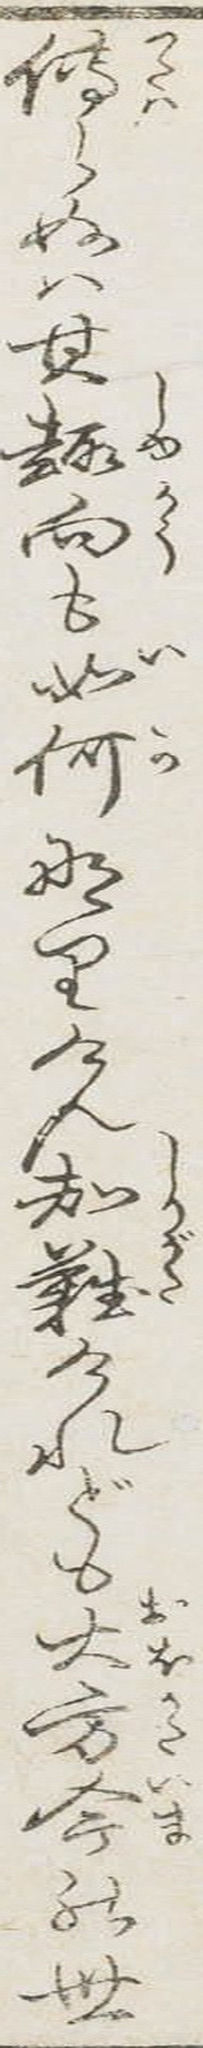伝らぬは其趣向も如何なりけん知難けれども大方今の世
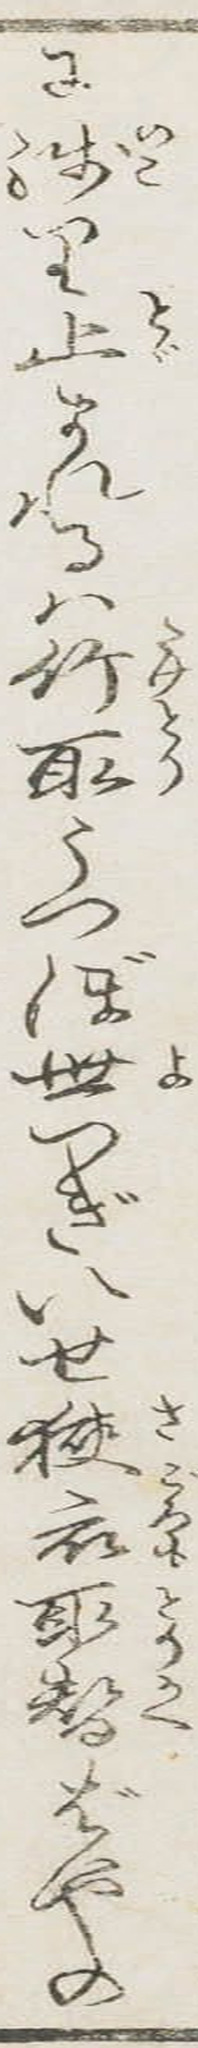に残り止まれるは竹取うつぼ世つぎいせ狭衣取替ばやの
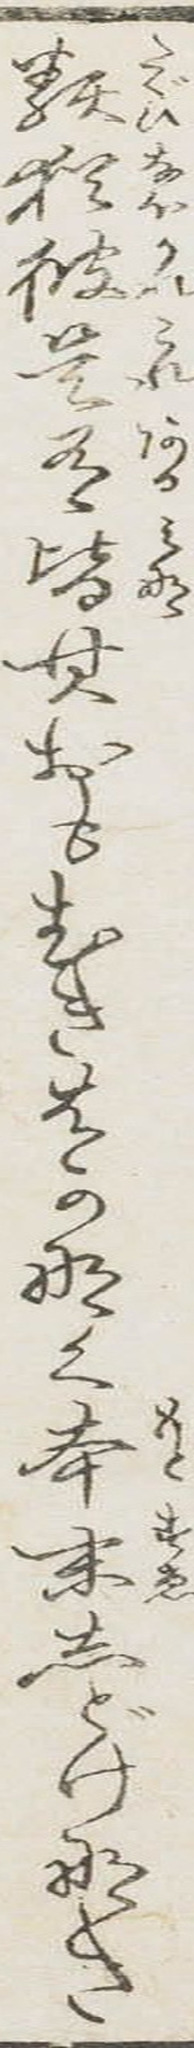類猶彼是有皆其おもむきはかなく本末しどけなき
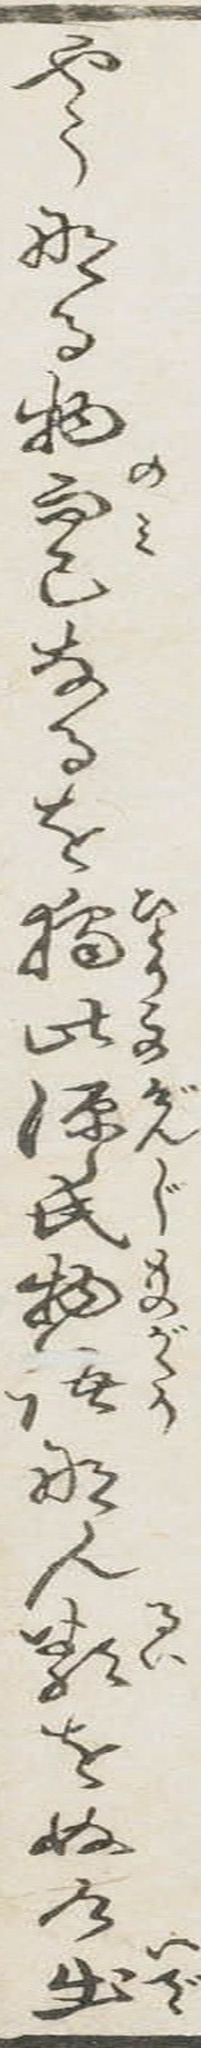やうなる物而已なるを独此源氏物語なん類をぬけ出
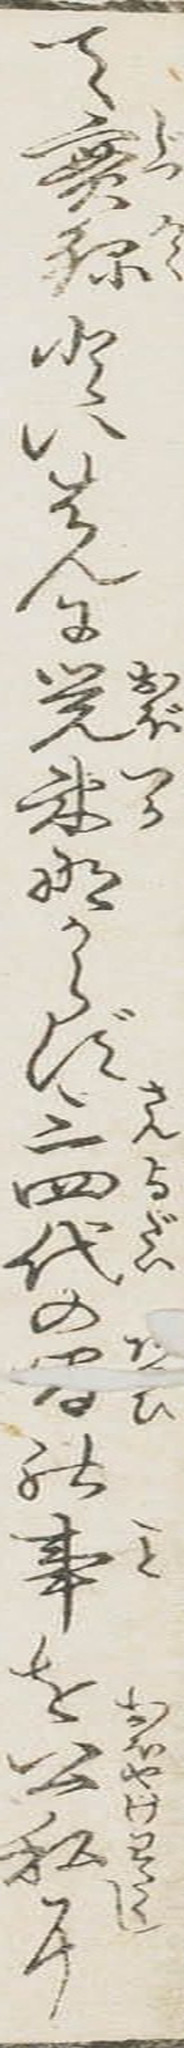て実録といはんに覚束なからず三四代の間の事を公私に
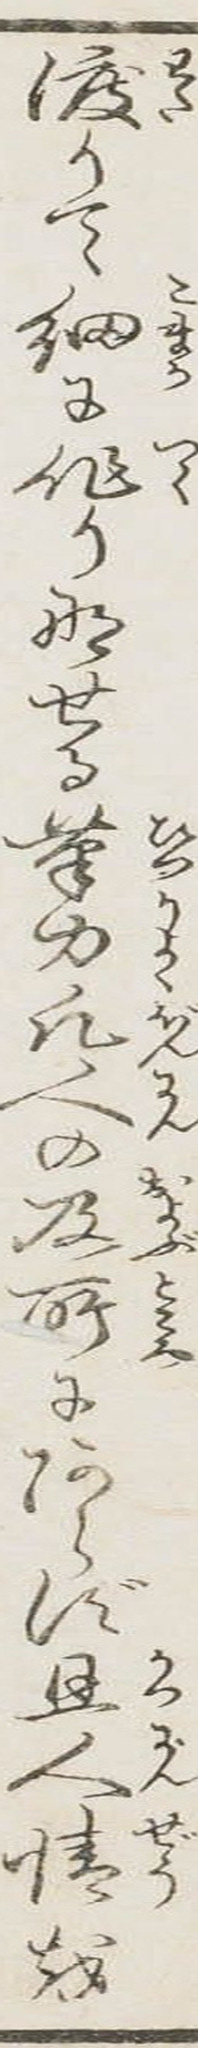渡りて細に作りなせる筆力凡人の及所にあらず且人情を
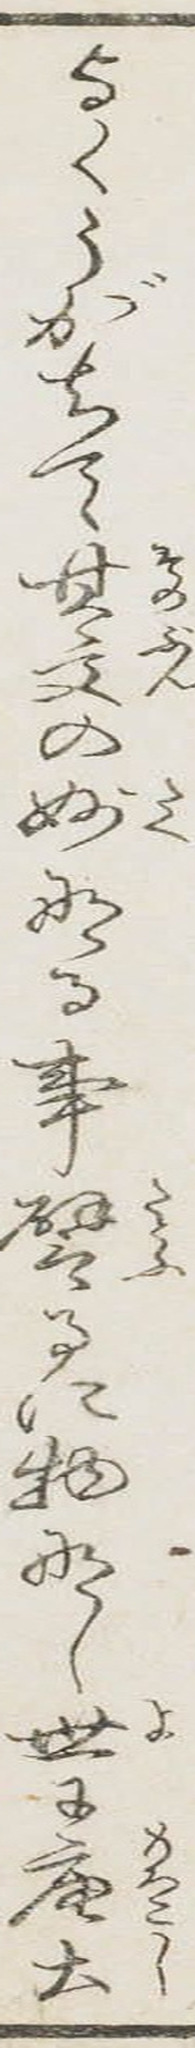よくうがちてそ其文の玅なる事譬るに物なし世に唐土
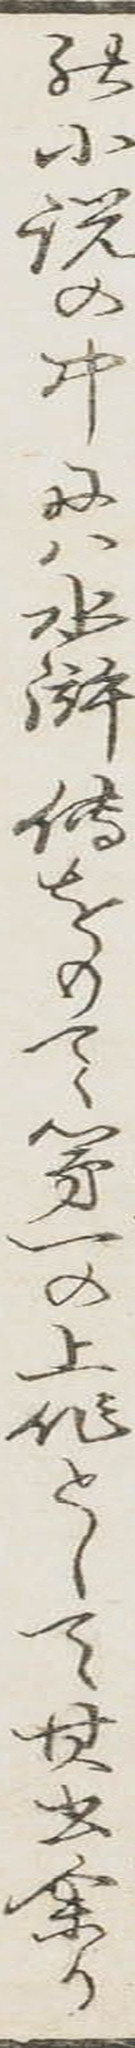の小説の中には水滸伝をもて第一の上作として其書余り
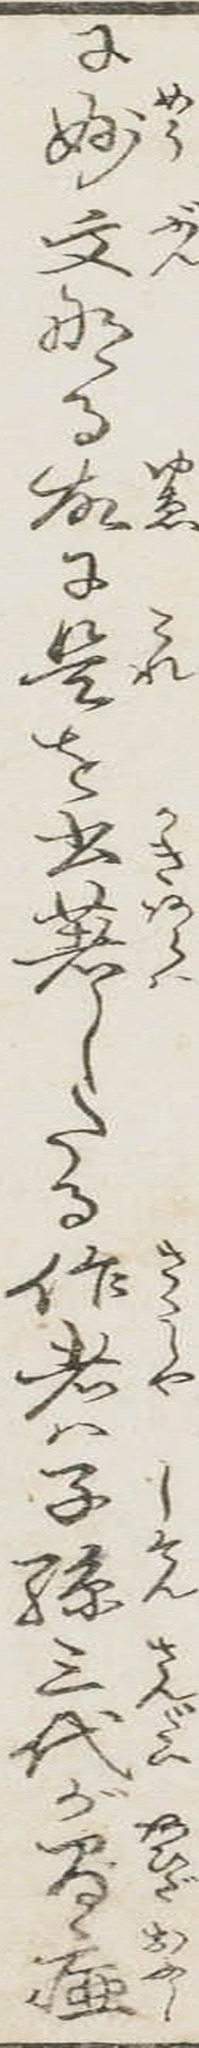に妙文なる故に是を書著したる作者は子孫三代が間瘂
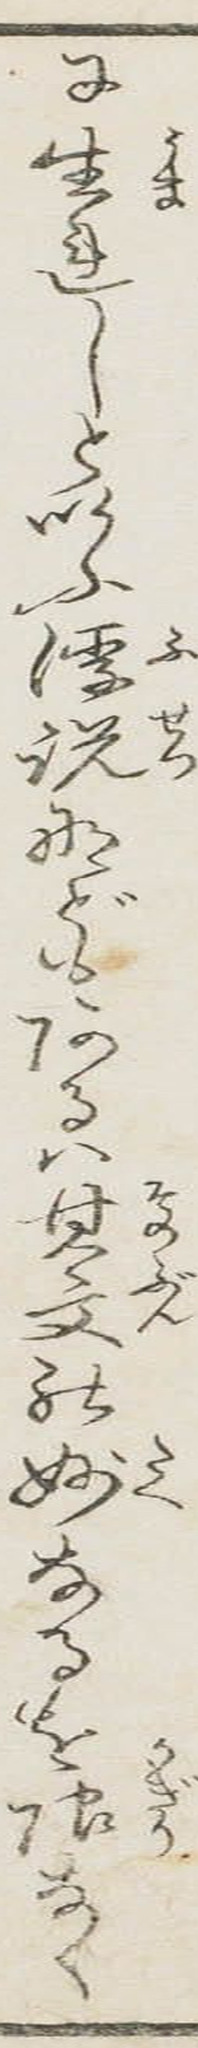に生れしといふ浮説などもあるは其文の妙なるを限なく
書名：源氏百人一首
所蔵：東京学芸大学教育コンテンツアーカイブ
